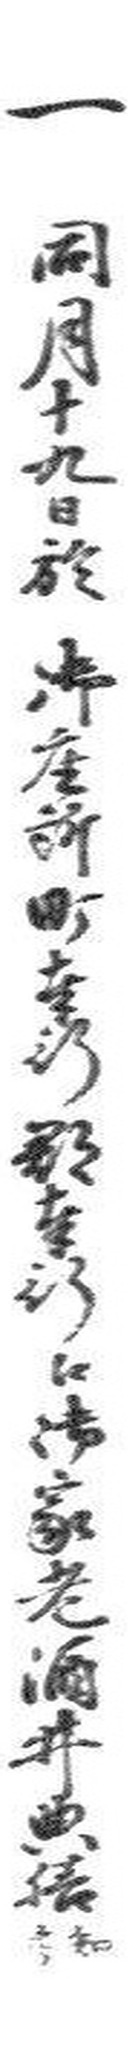一同月十九日於御座所町奉行郡奉行江御家老酒井典膳知房
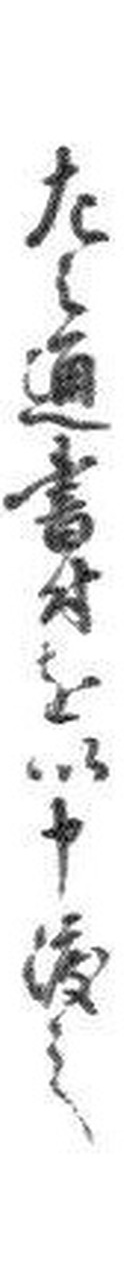左之通書付を以申渡之
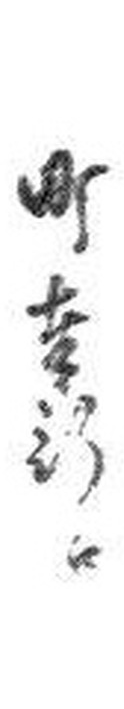町奉行江
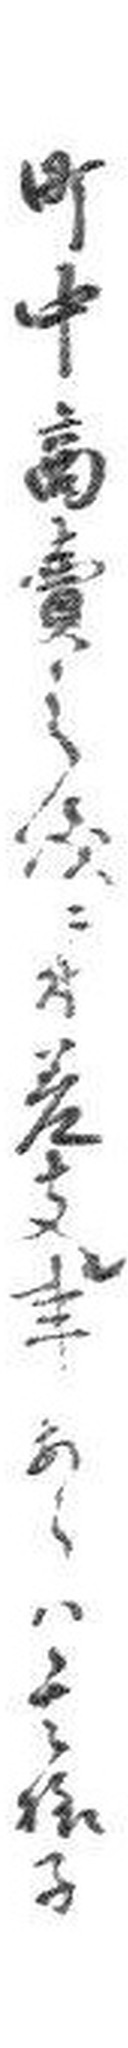町中商売之儀ニ付差支ル事あらハ其様子
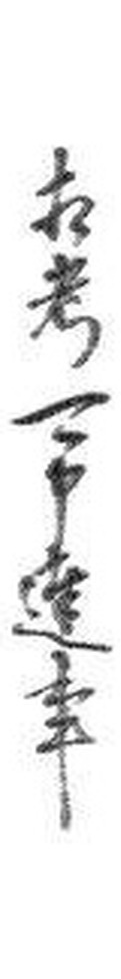相考可申達事
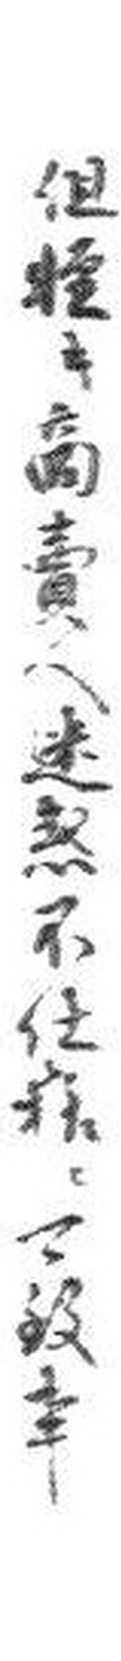但軽キ商売人迷惑不仕様ニ可致事
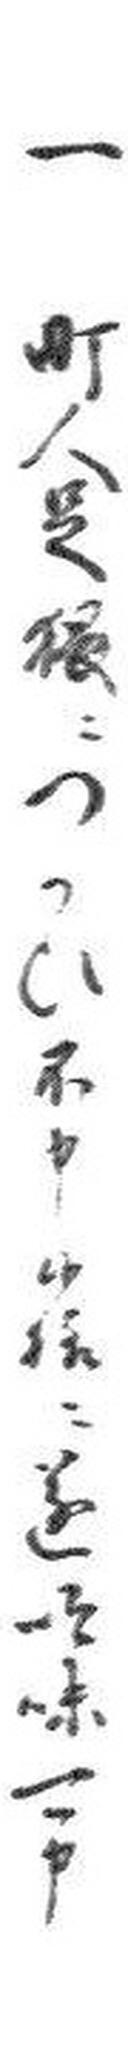一町人足猥ニつかひ不申様ニ遂吟味可申

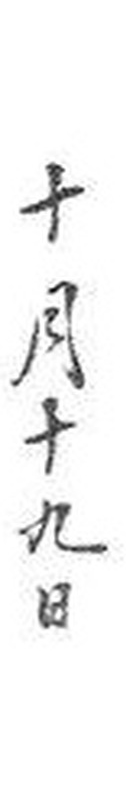十月十九日
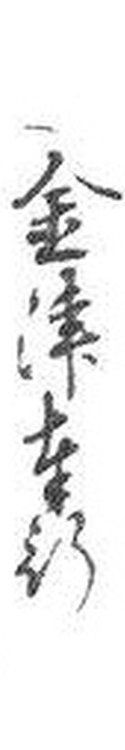金津奉行
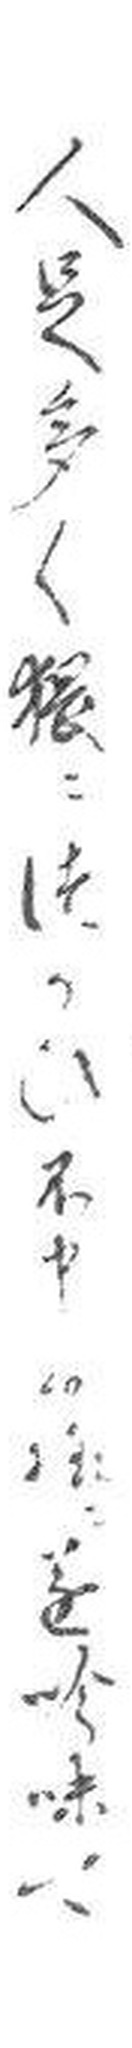人足多く猥ニつかひ不申候様ニ遂吟味可
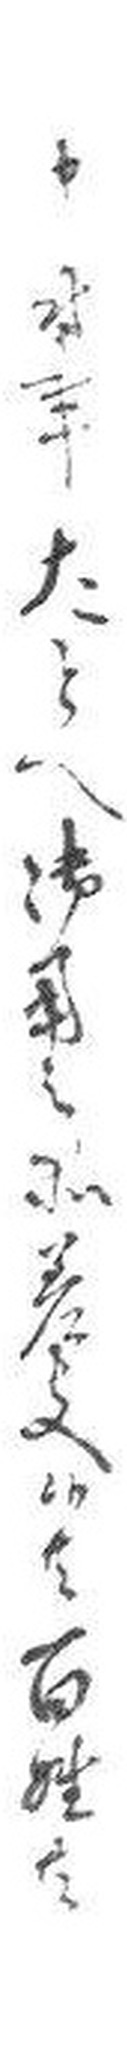申付事たとえ御用之品差支候共百姓共
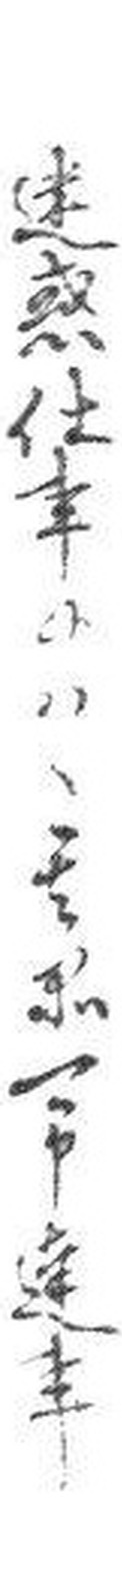迷惑仕事候ハヽ其品可申達事
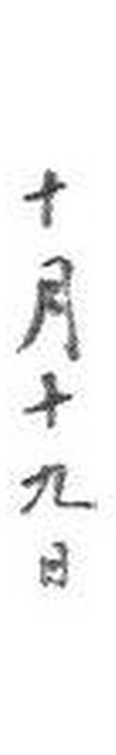十月十九日
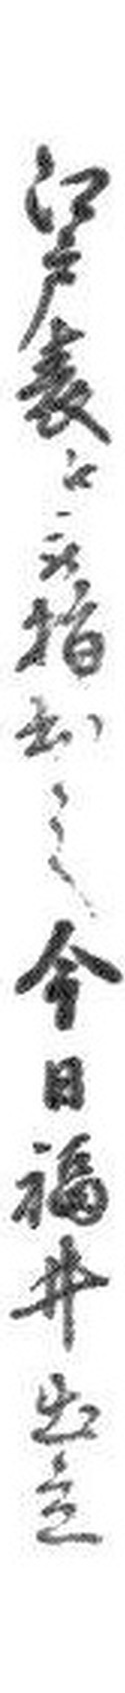江戸表江被指出之今日福井出立
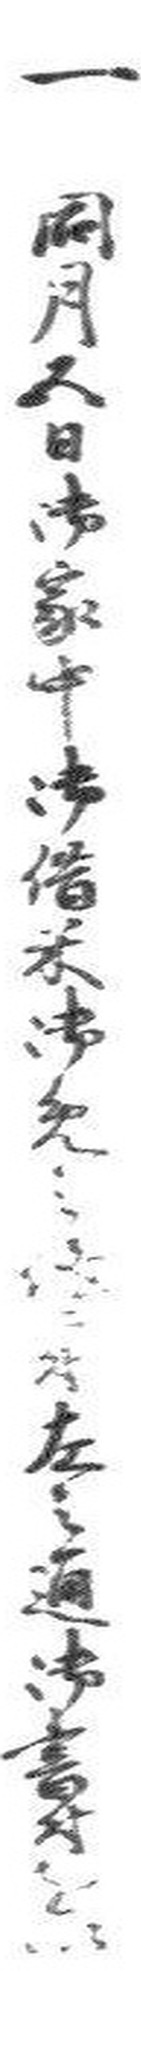一同月五日御家中御借米御免之儀ニ付左之通御書付を以
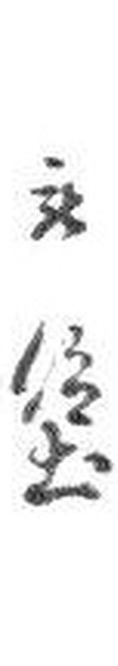被仰出
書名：家譜 二十八 吉邦公 従宝永七年七月五日到正徳元年十二月
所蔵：福井県文書館 Fukui Prefectural Archives
